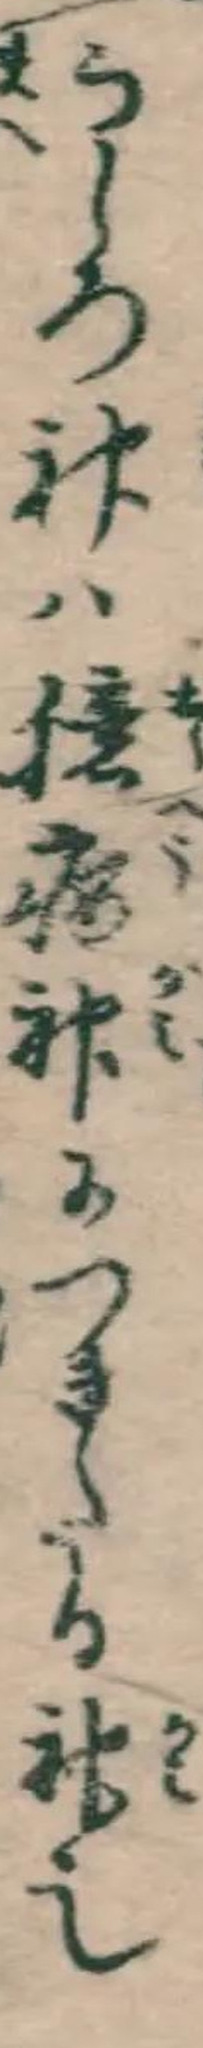うしろ神は臆病神につきたる神也
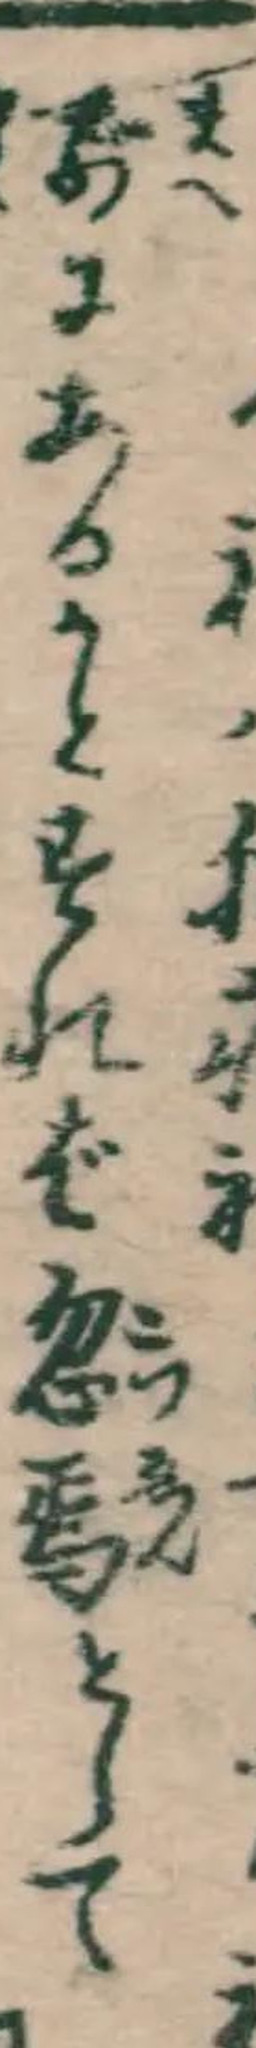前にあるかとすれば忽焉として
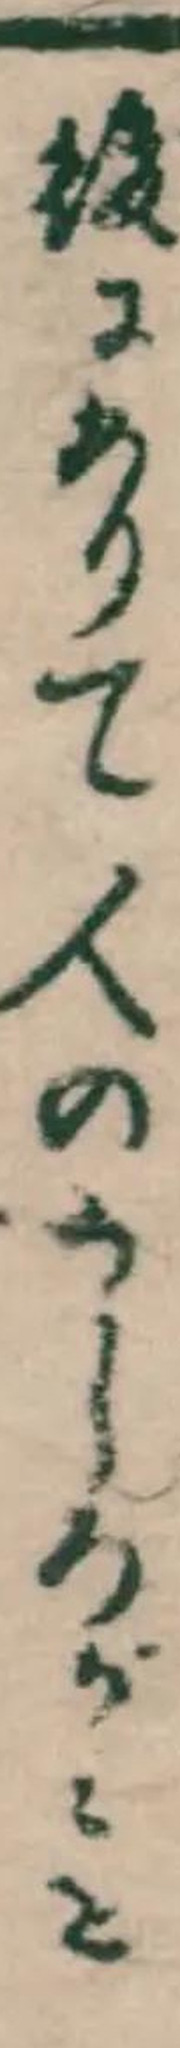後にありて人のうしろがみを
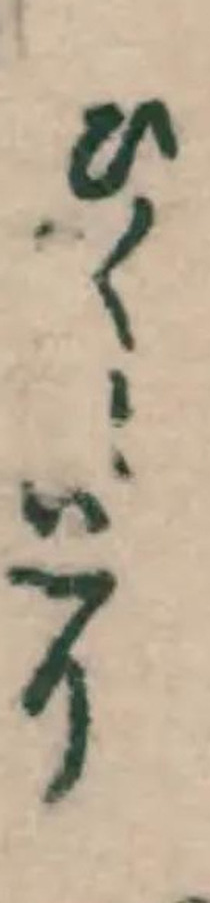ひくといへり

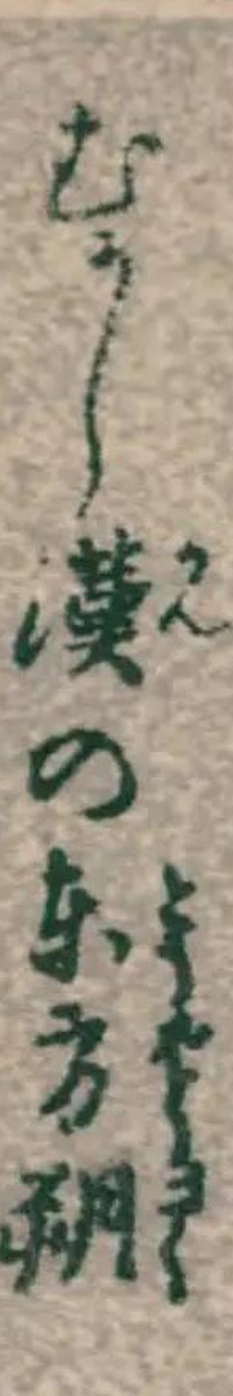むかし漢の東方朔
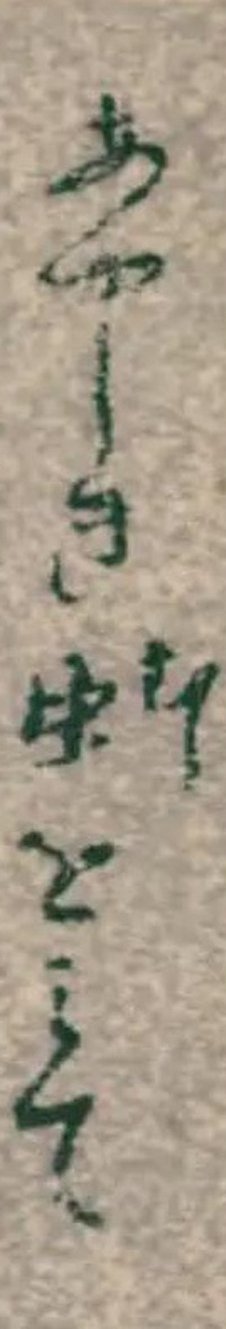あやしき虫をみて
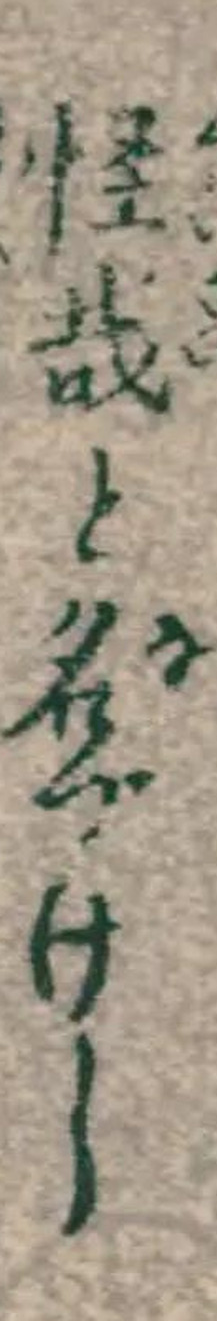怪哉と名づけし
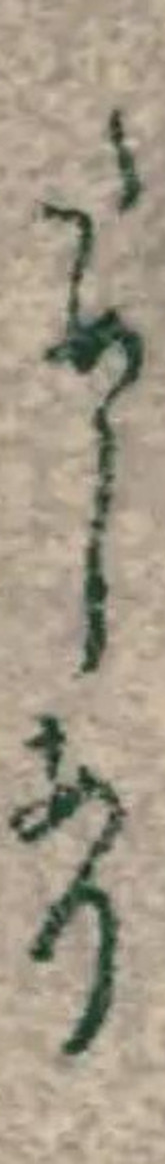ためしあり
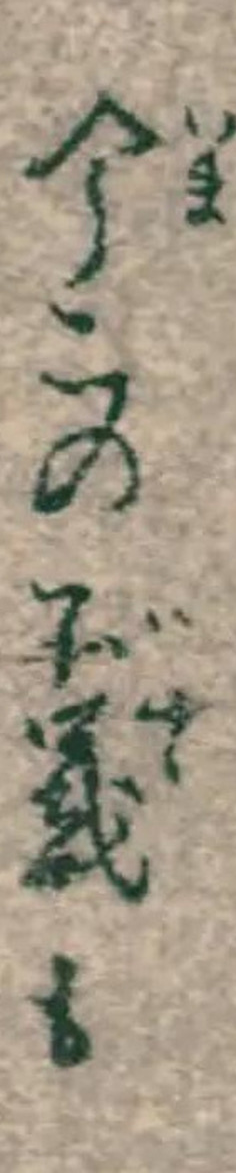今この否哉も
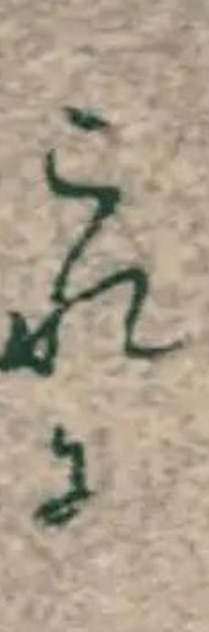これに
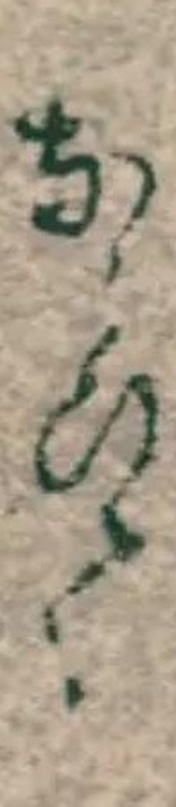ならひて
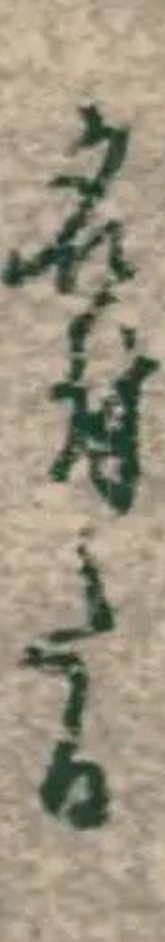名付たる
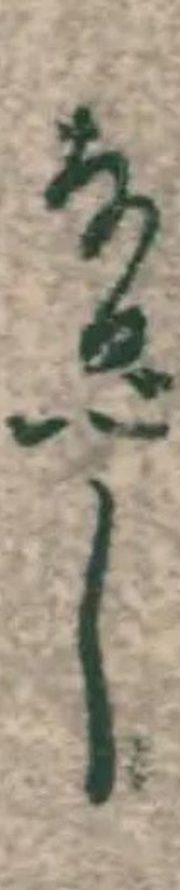なるべし
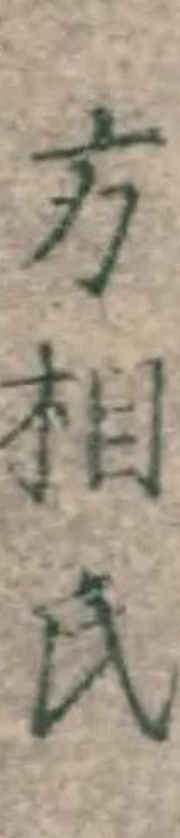方相氏
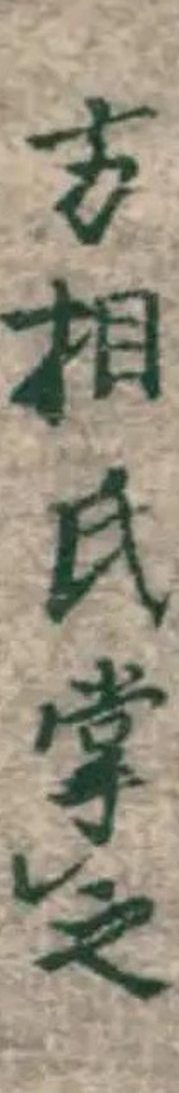方相氏掌之

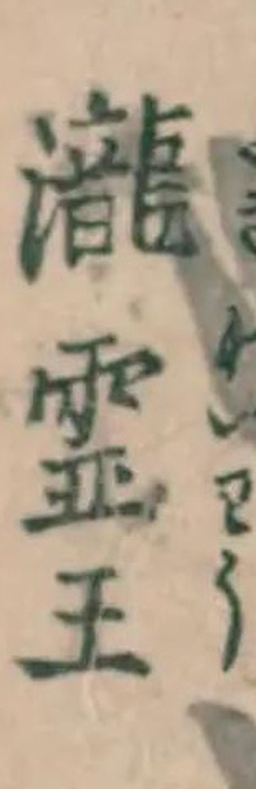滝霊王
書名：百鬼夜行 3巻拾遺3巻. [2]
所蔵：国立国会図書館 National Diet Library, JAPAN
